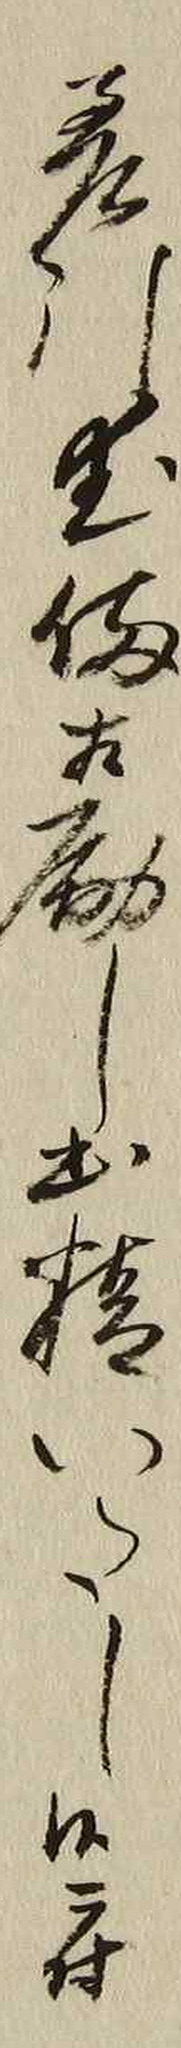差引武備相励し出精いたし候ニ付
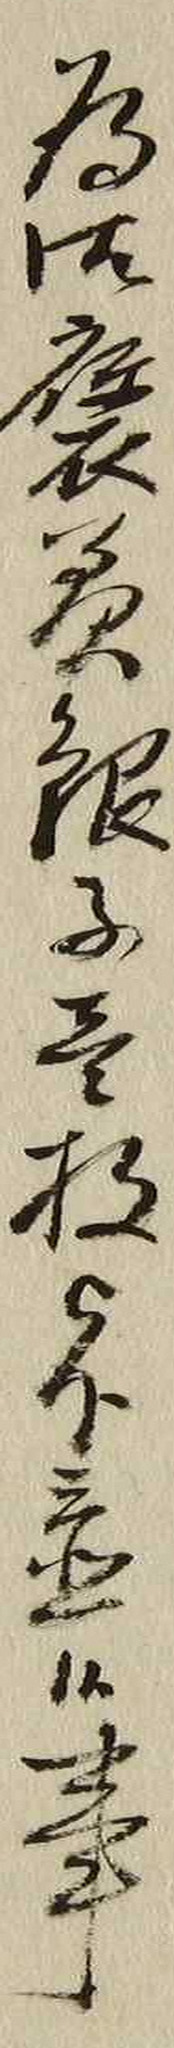為御褒美銀子壱枚被下置候事
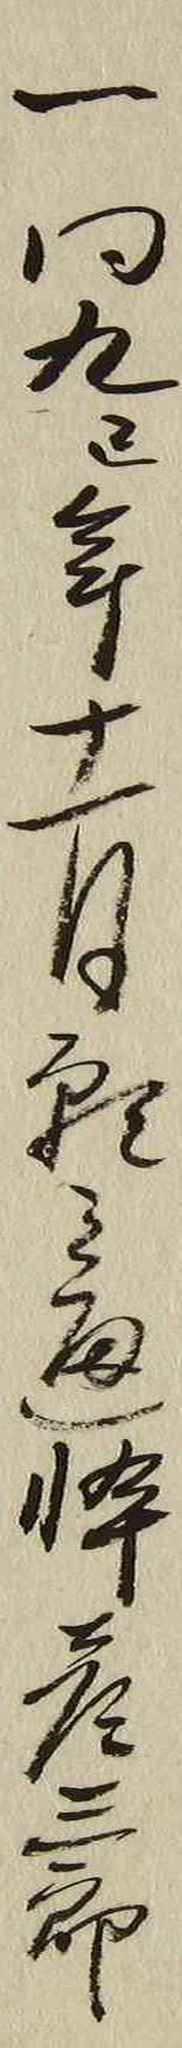一同九巳年十一月願之通忰彦三郎
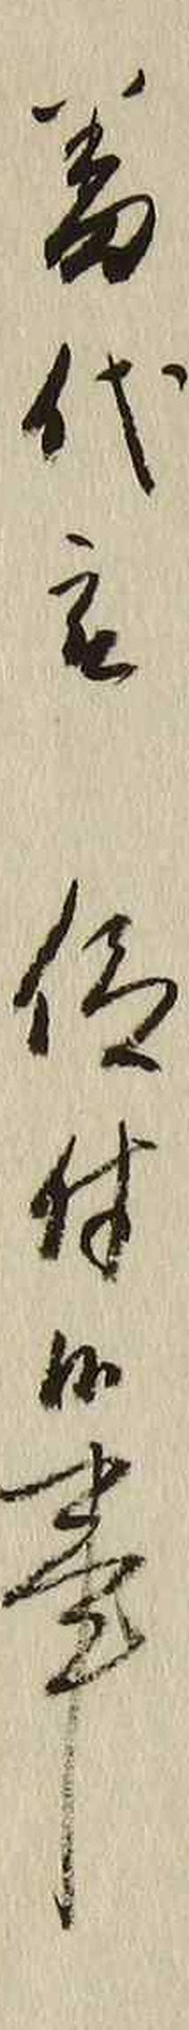番代被仰付候事
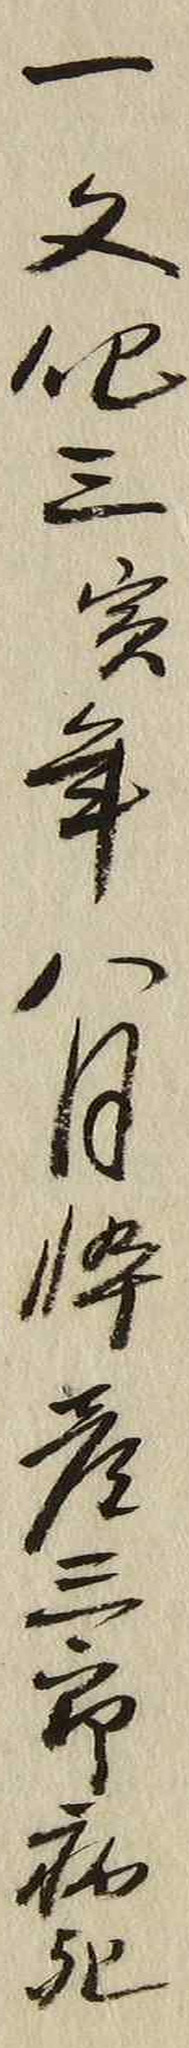一文化三寅年八月忰彦三郎病死
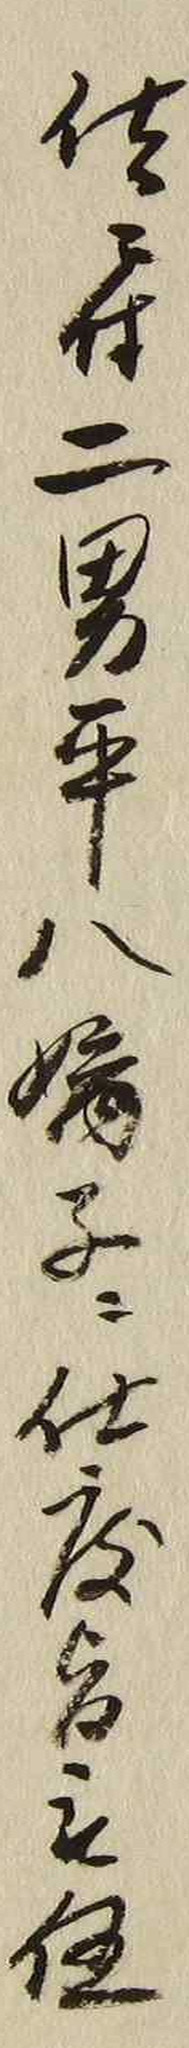仕候ニ付二男平八嫡子ニ仕度旨被任
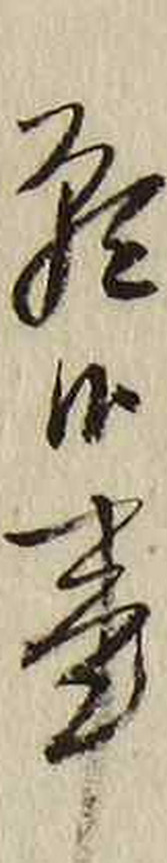願候事
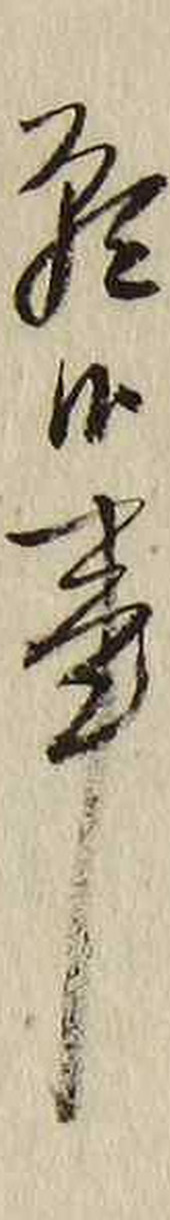願候事
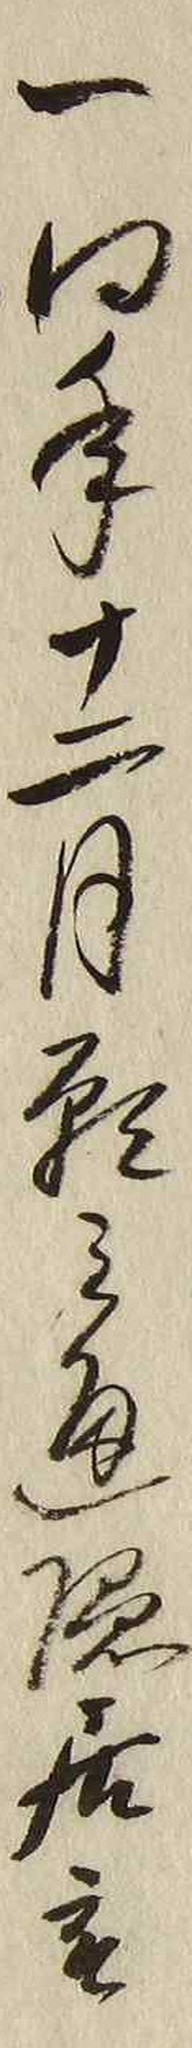一同年十二月願之通隠居被
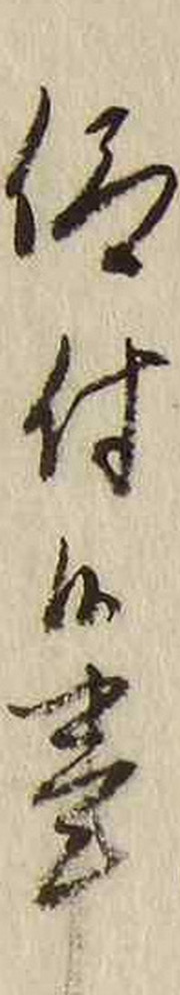仰付候事

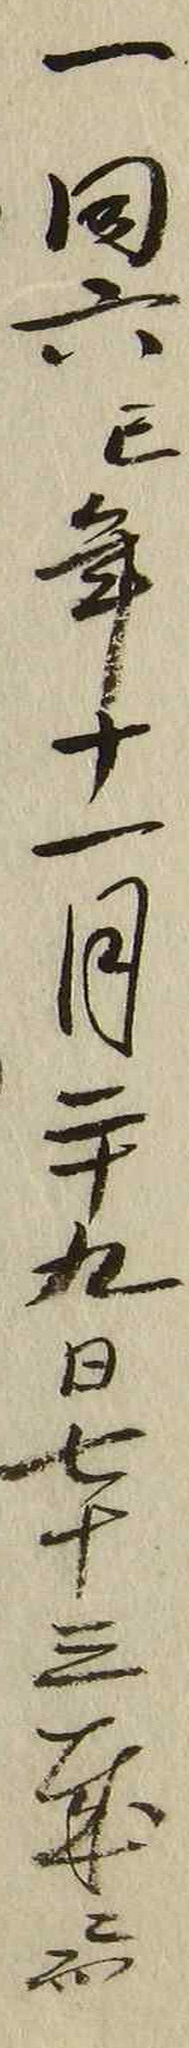一同六巳年十一月二十九日七十三歳ニ而
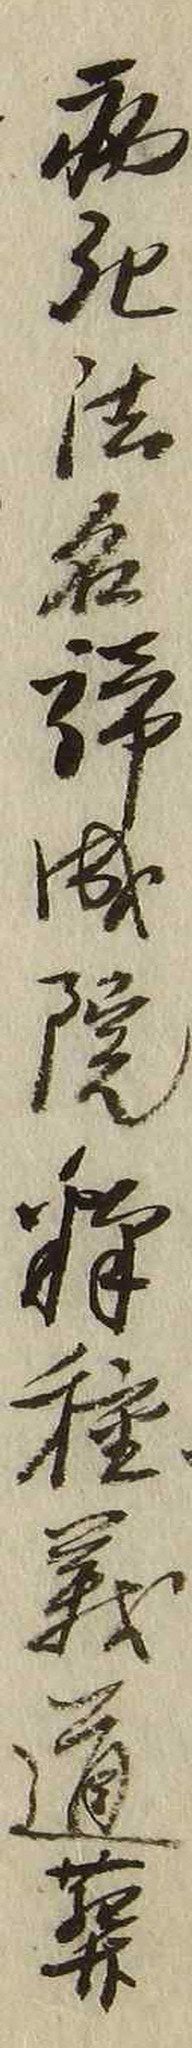病死法名禘成院釈種義道葬
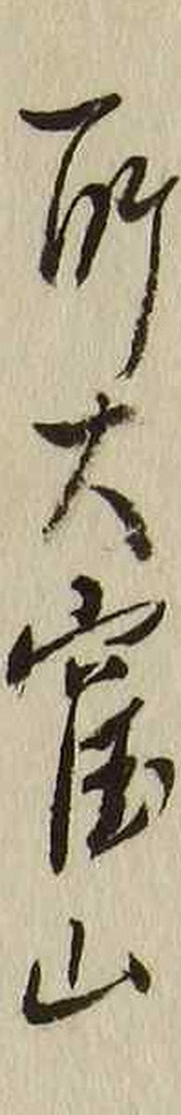所大窪山
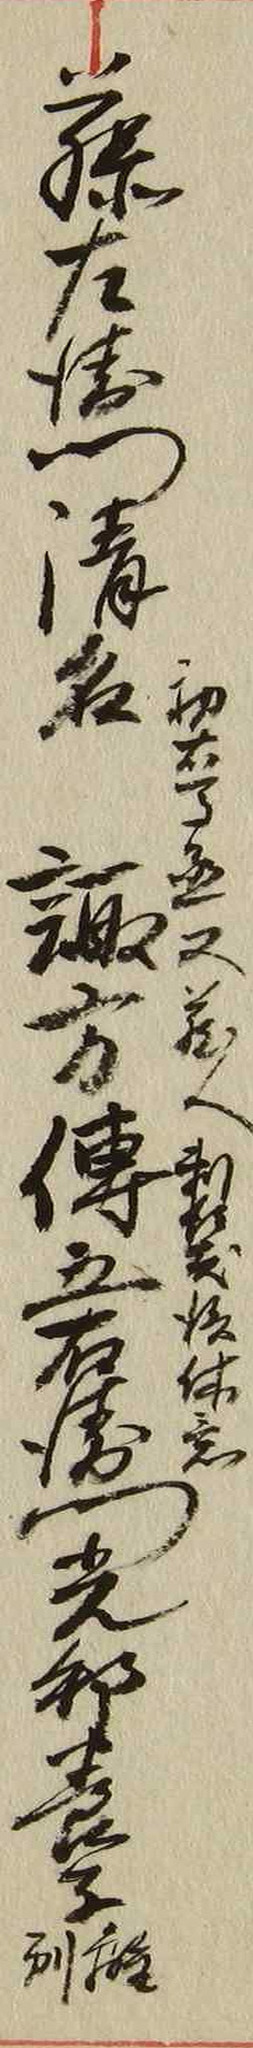藤左衛門清名諏方伝五右衛門光邦養子離別
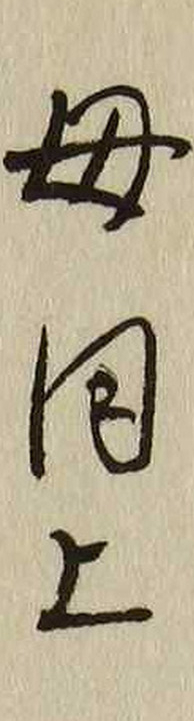母同上
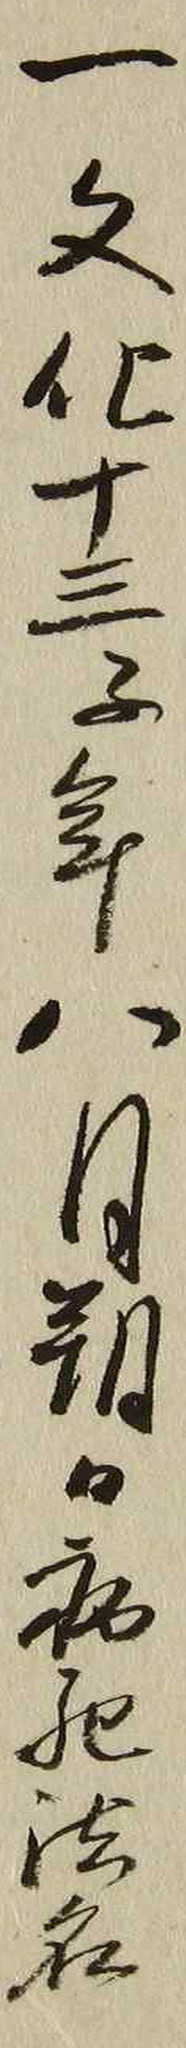一文化十三子年八月朔日病死法名
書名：諸士系譜　巻之356　す之部6
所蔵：会津若松市立会津図書館
